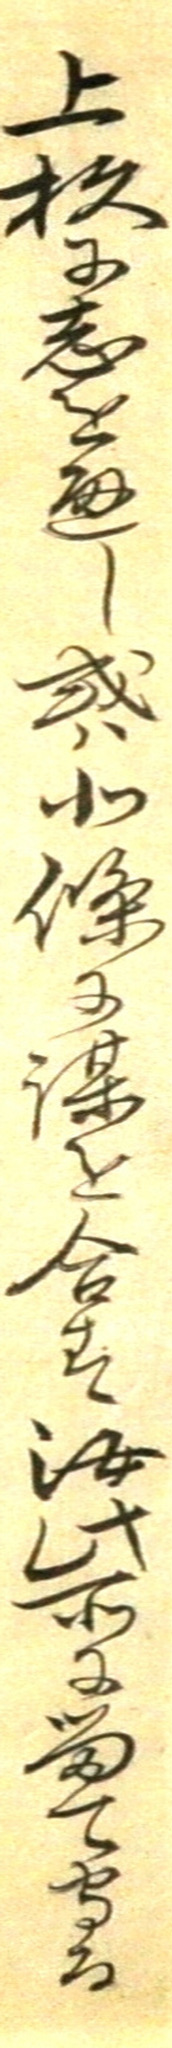上杉に志を通し或は北條に謀を合す汝此所に留て守る
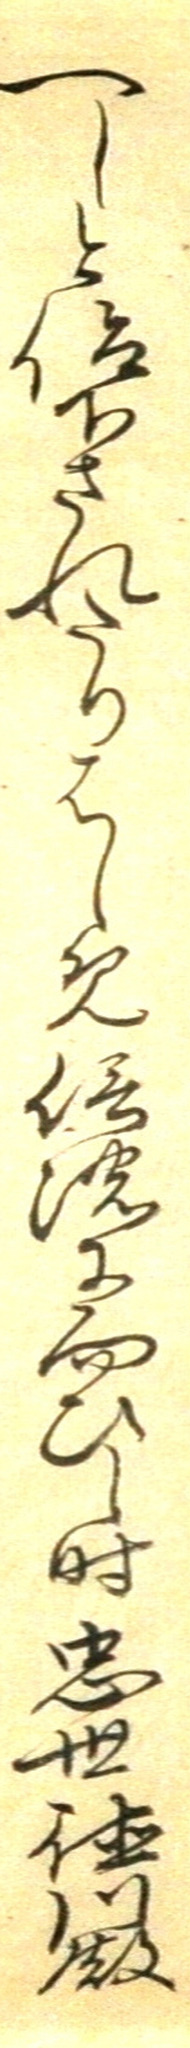へしと仰下されたりはしめ信濃に向ひし時忠世徳川殿
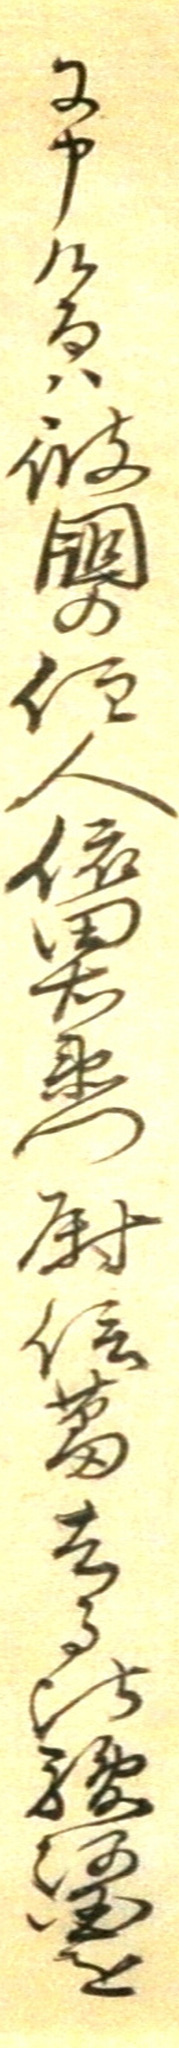に申けるは彼国の住人依田右衛門尉信蕃去る比駿河国を
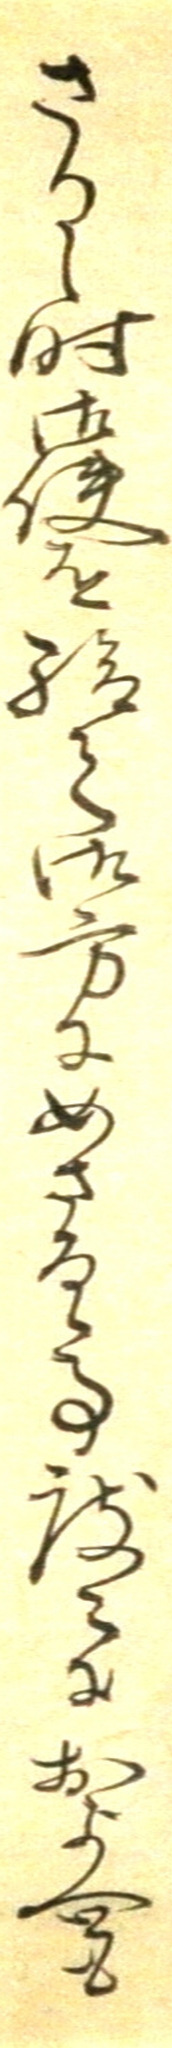さりし時御使を給て御方にめさるゝ事度々におよへとも
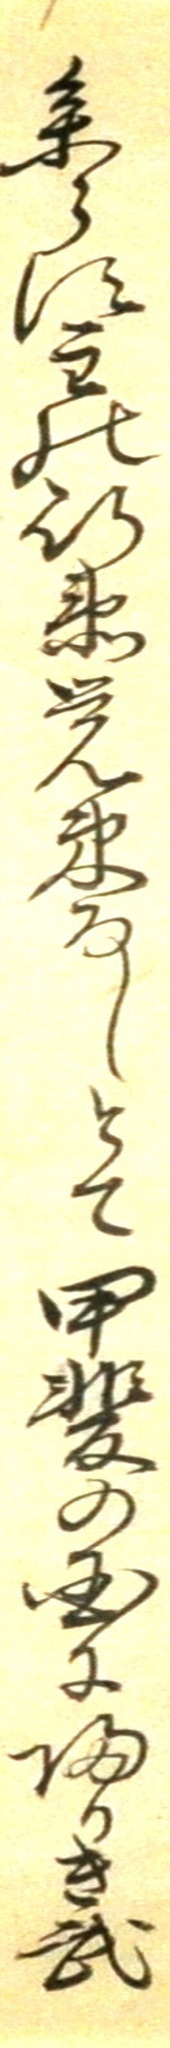参らす主の行衛覚束なしとて甲斐の国に帰りき武
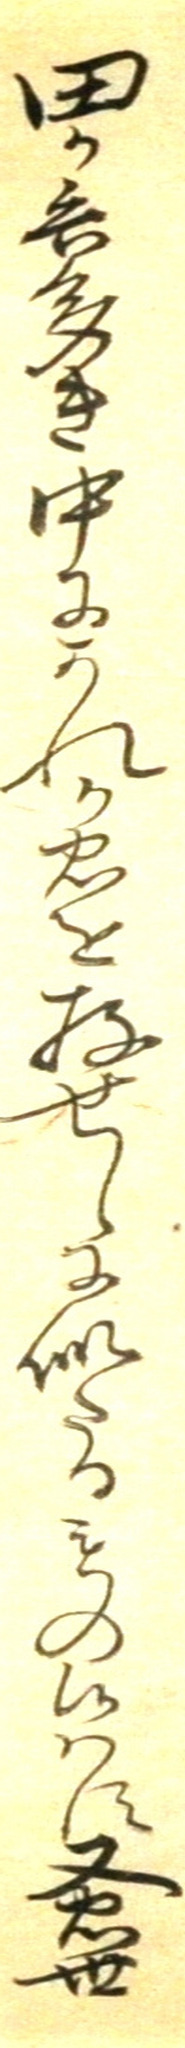田か兵多き中にかれか忠を存せしに似たるもの候はす又忠世
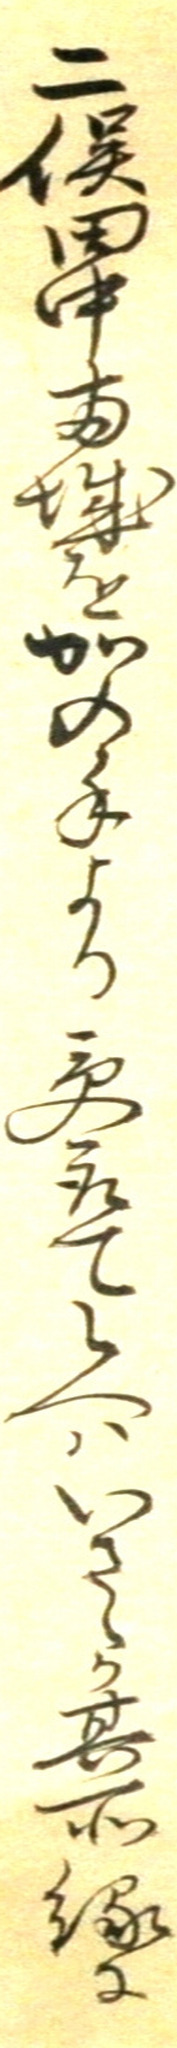二俣田中両城をかの手より受取て候へはいさゝか其所縁に
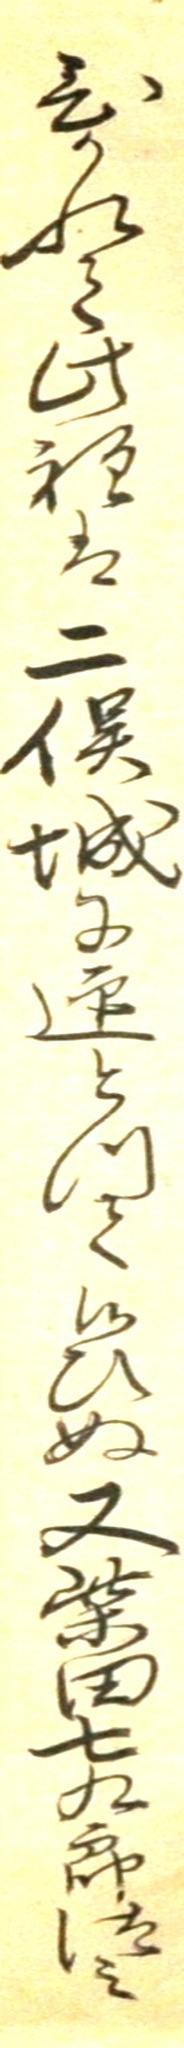ひかれて此程は二俣城に迎とつて候ひぬ又柴田七九郎つみ
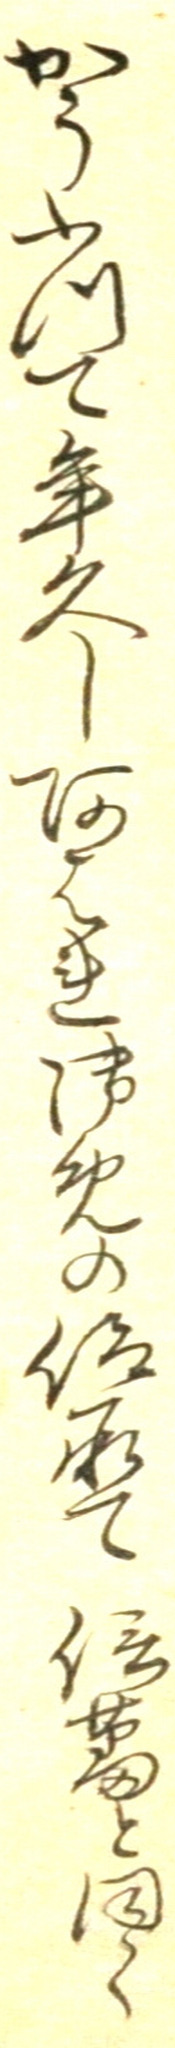かうふつて年久しあはれ御免の仰承て信蕃と同く
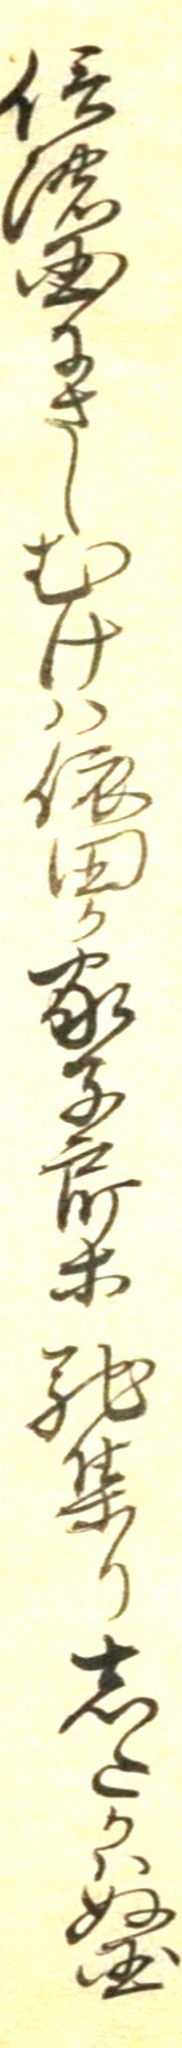信濃国にさしむけは依田か家子郎等馳集りしたかはぬ国
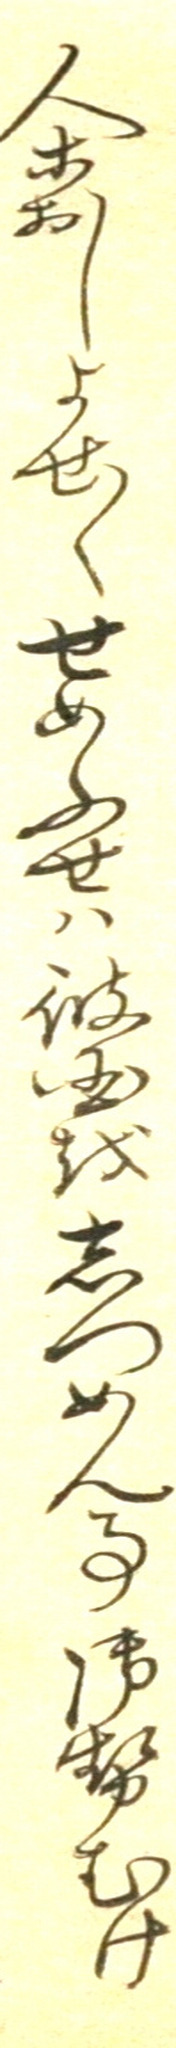人等おしよせ〳〵せめふせは彼国をしつめん事御勢むけ
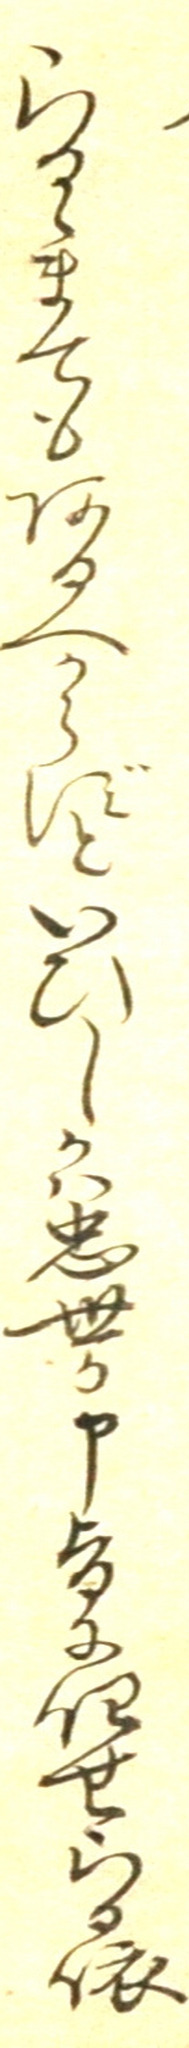らるゝまてもあるへからずといひしかは忠世か申旨に任せらる依
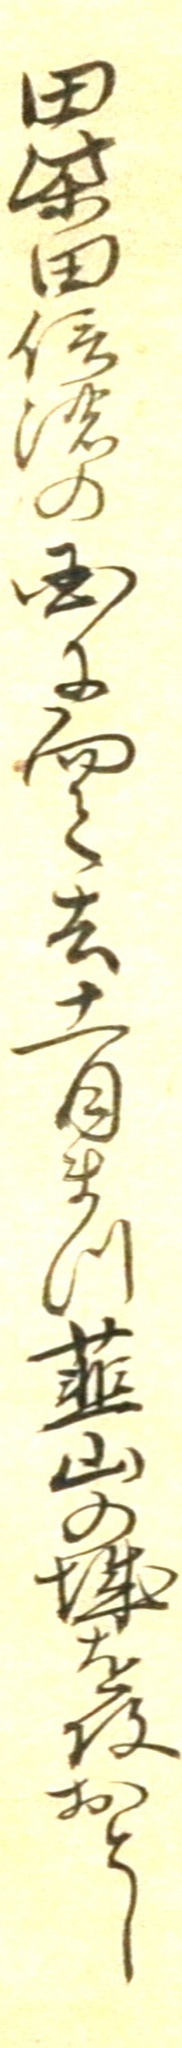田柴田信濃の国に向て去十一月まつ韮山の城を攻おとし

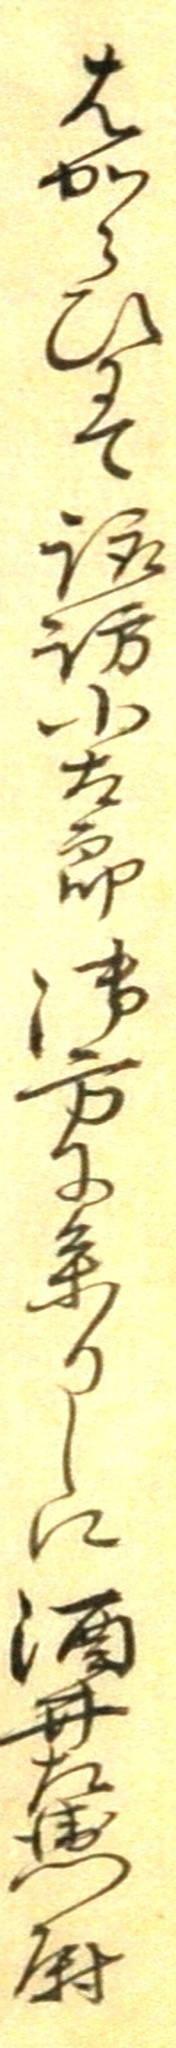はからひにて諏訪小太郎御方に参りしに酒井左衛門尉
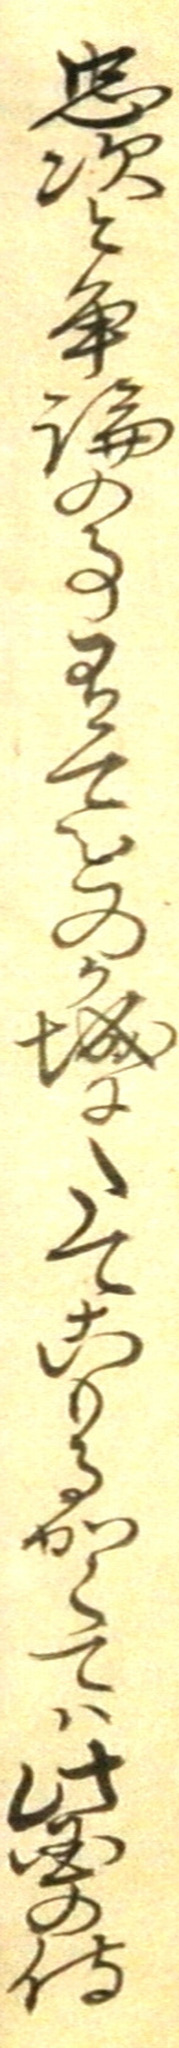忠次と争論の事有てをのか城にたてこもるかくては此国の侍
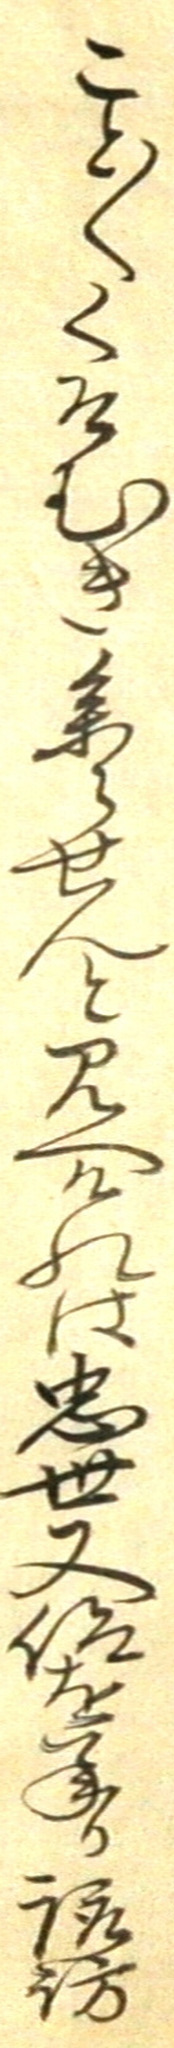こと〳〵くそむき参らせんと見へけれは忠世又仰を承り諏訪
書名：藩翰譜（四・中）
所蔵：伊那市立高遠町図書館・合同会社AMANE
